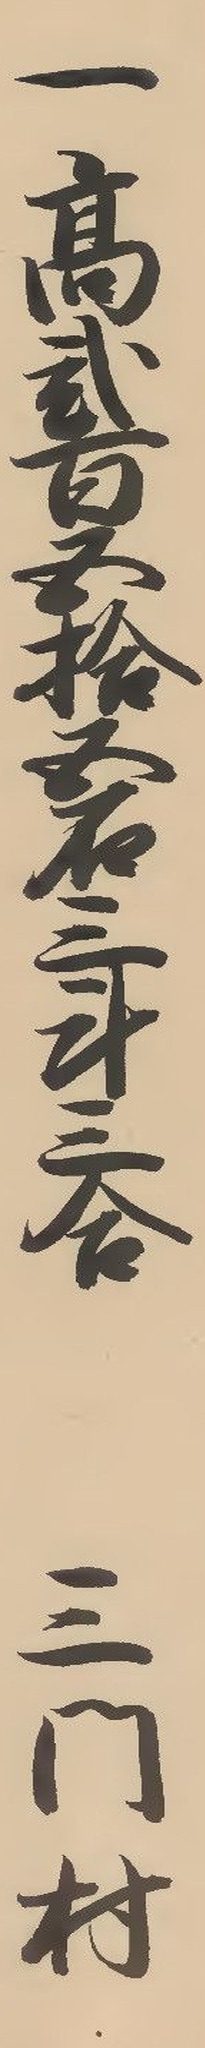一高弐百五拾五石三斗三合三門村
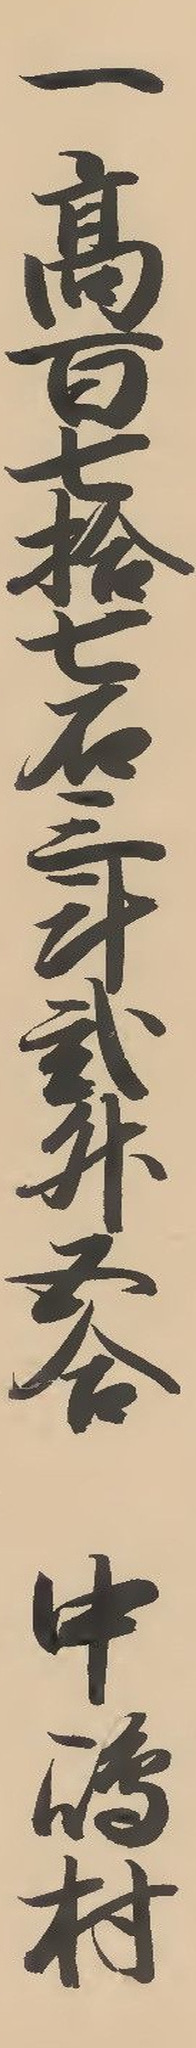一高百七拾七石三斗弐升五合中島村
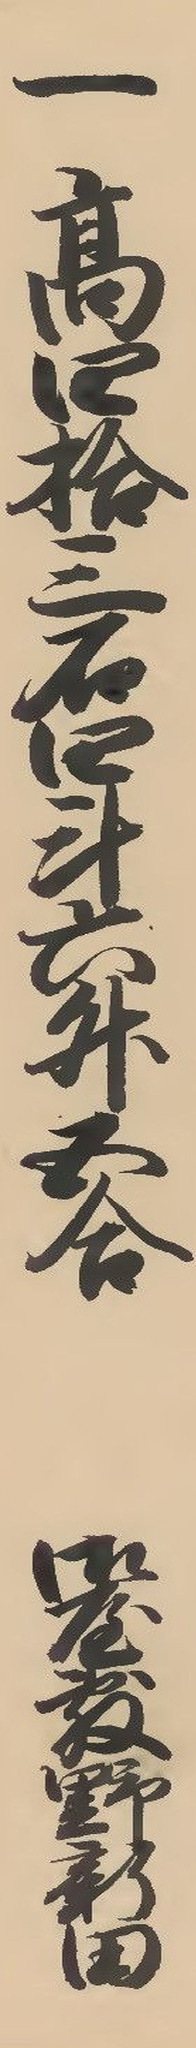一高四拾三石四斗六升五合御屋敷野新田

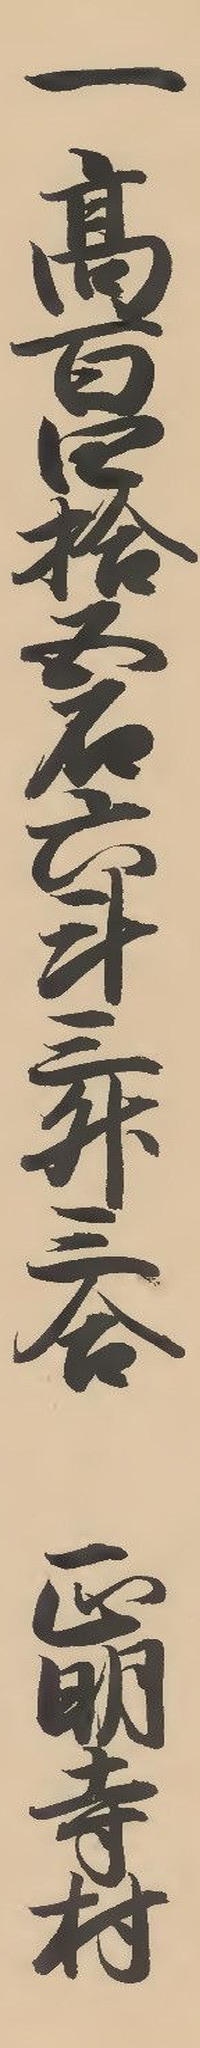一高百四拾五石六斗三升三合正明寺村
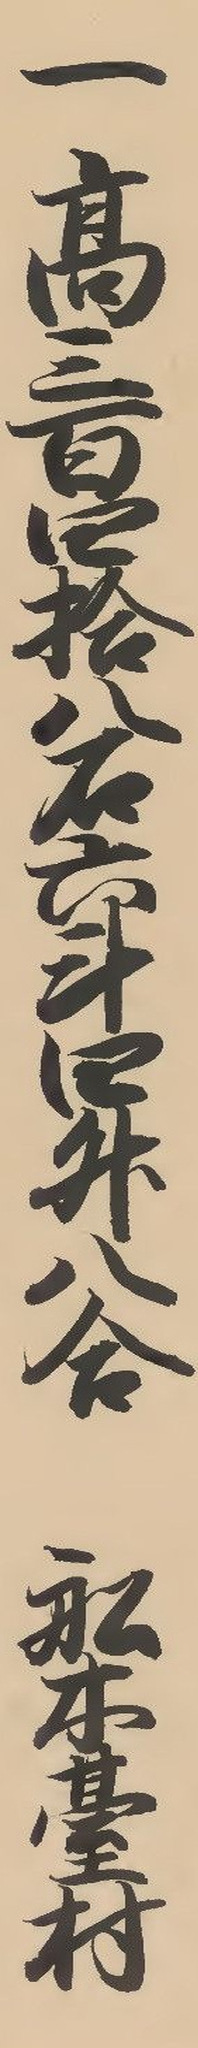一高三百四拾八石六斗四升八合船木台村
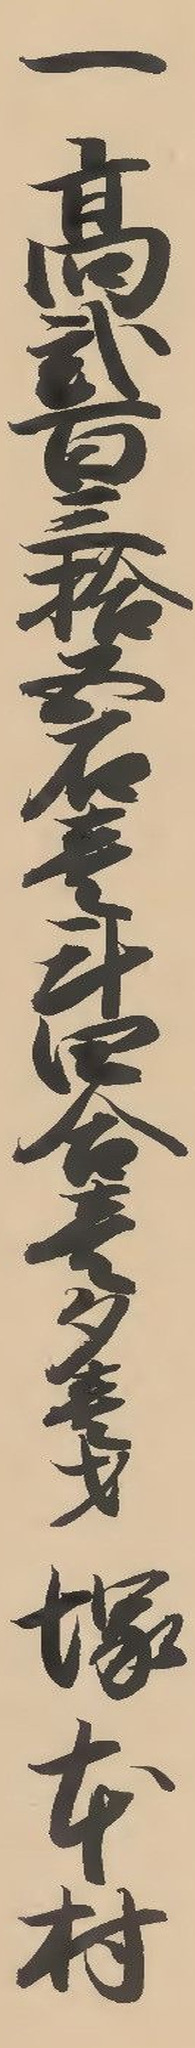一高弐百三拾五石壱斗四合壱勺壱才塚本村
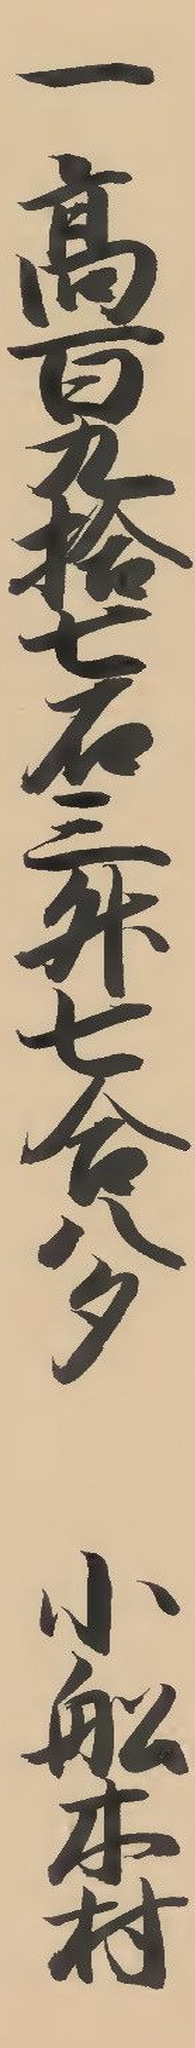一高百九拾七石三升七合八勺小船木村
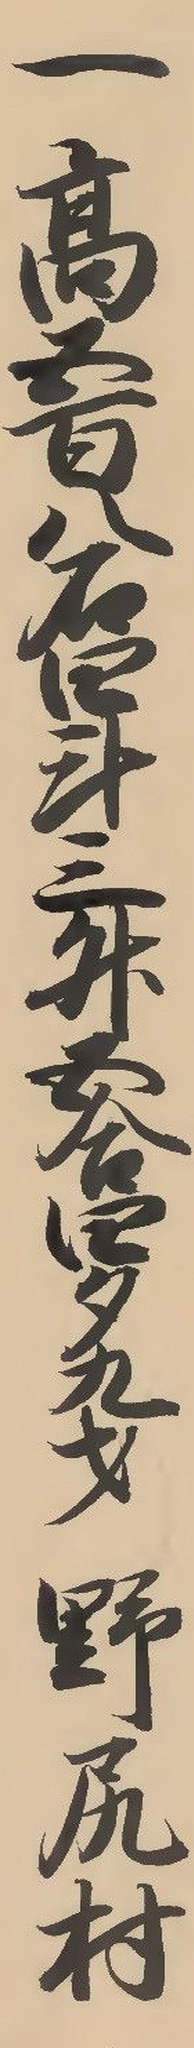一高五百八石四斗三升五合四勺九才野尻村
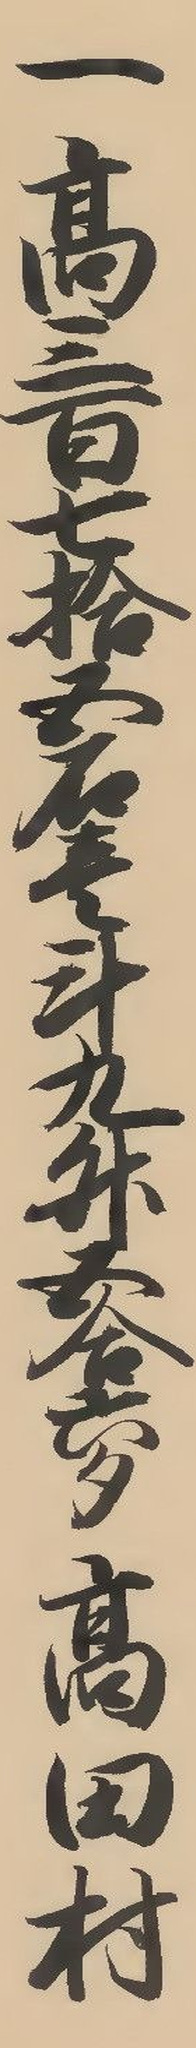一高三百七拾五石壱斗九升五合六勺高田村
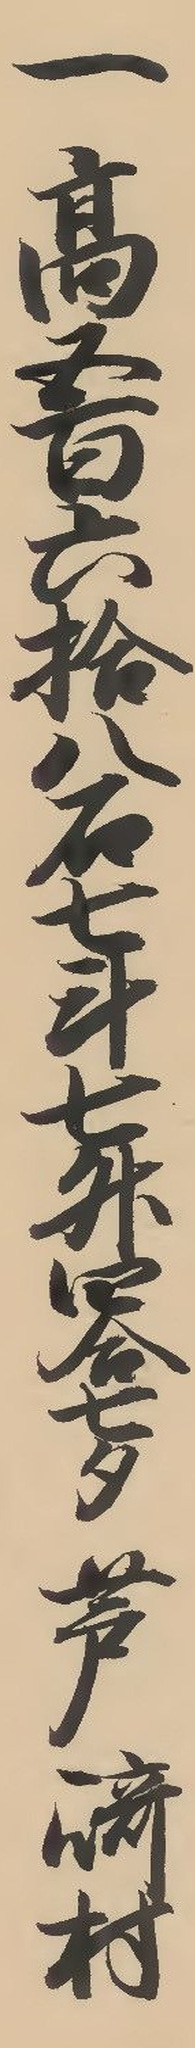一高五百六拾八石七斗七升四合七勺芦崎村

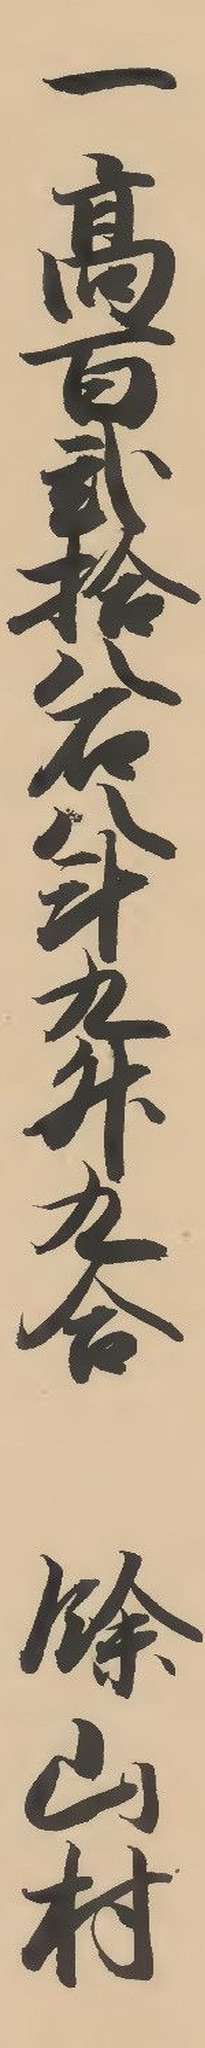一高百弐拾八石八斗九升九合余山村
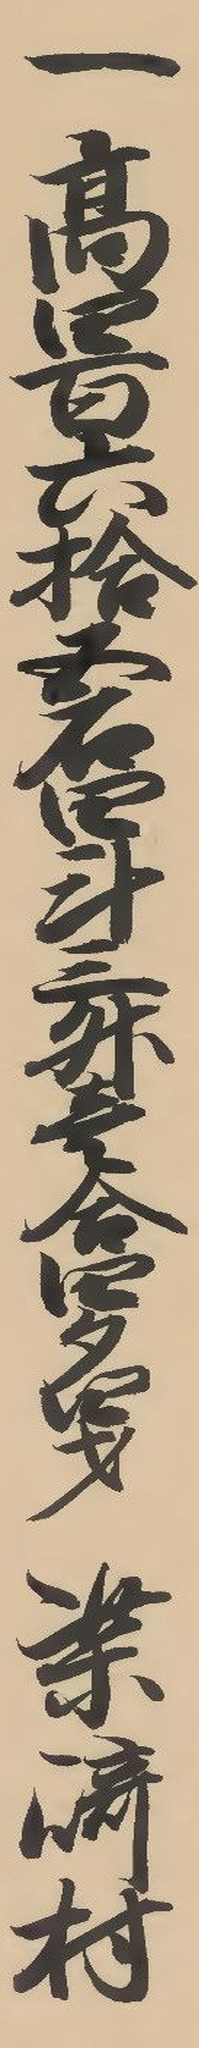一高四百六拾五石四斗三升壱合四勺四才柴崎村
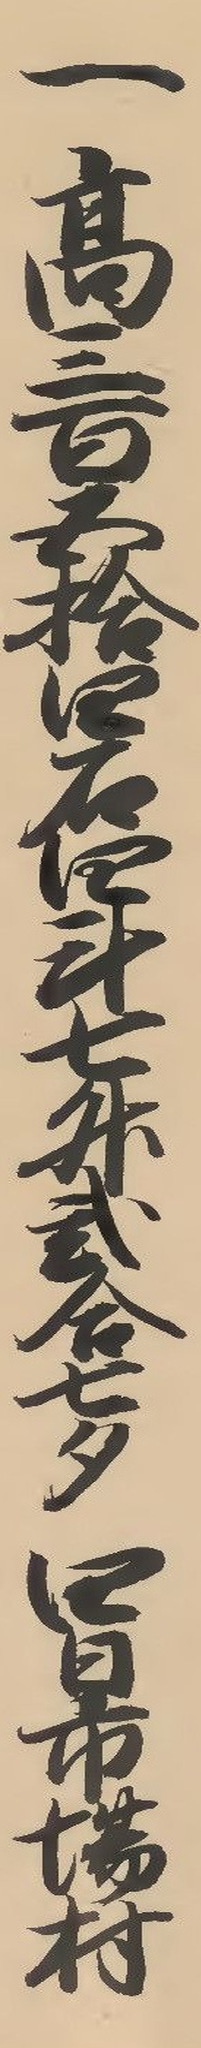一高三百五拾四石四斗七升弐合七勺四日市場村
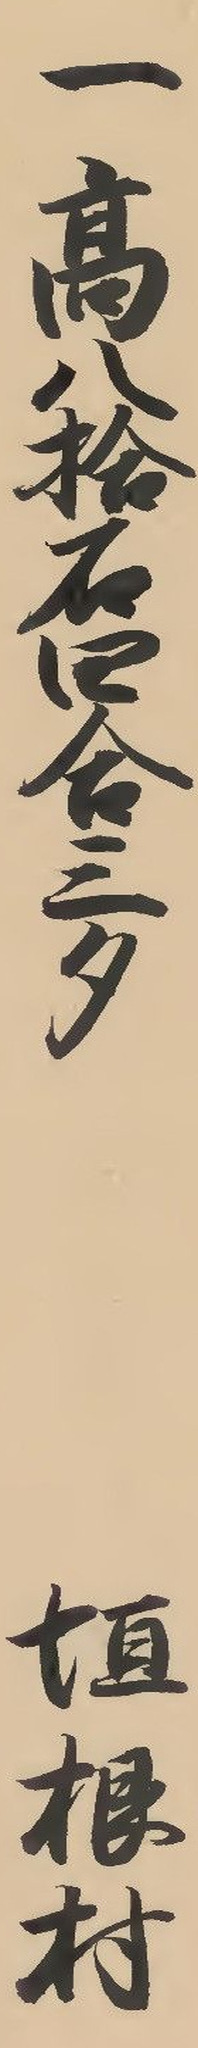一高八拾石四合三勺垣根村
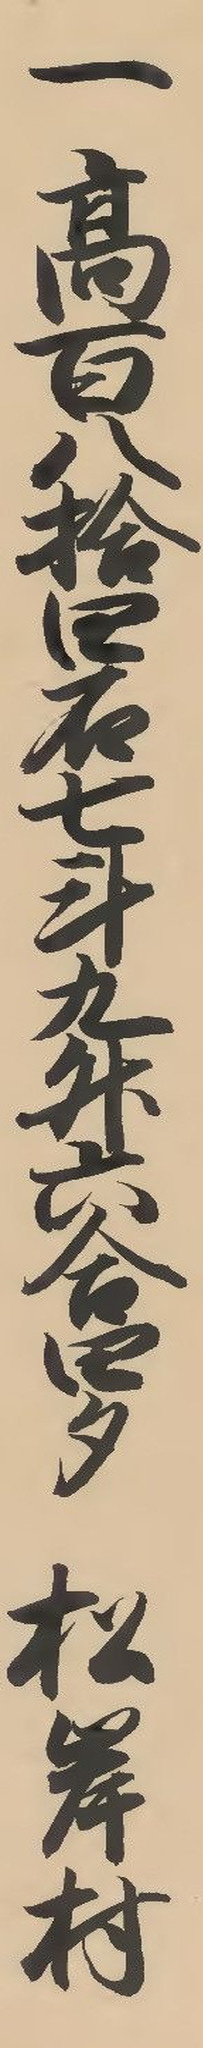一高百八拾四石七斗九升六合四勺松岸村
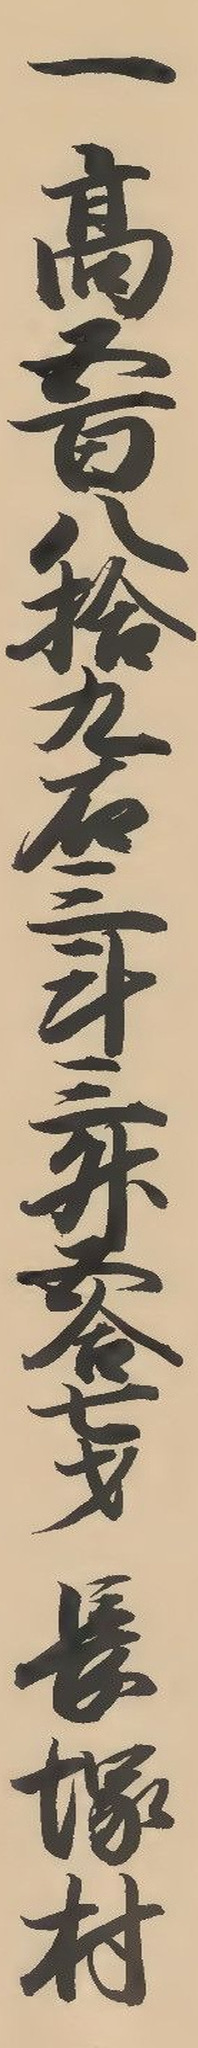一高五百八拾九石三斗三升五合七才長塚村
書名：下総国郷帳
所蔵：国立公文書館 National Archives of Japan
